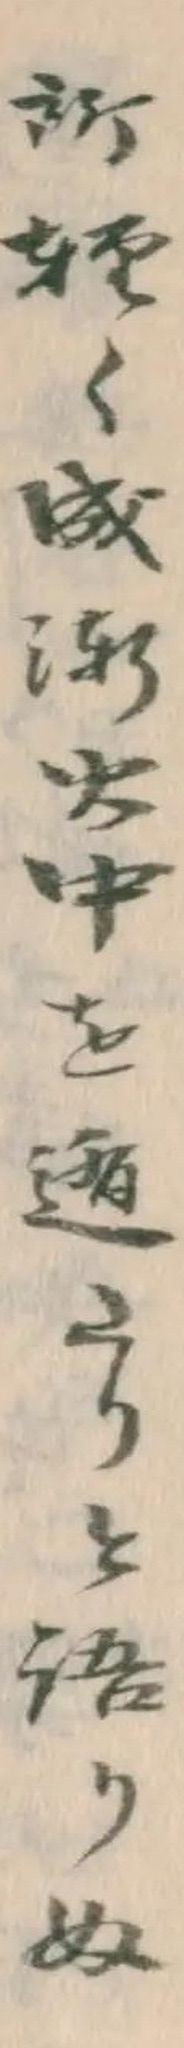所軽く成漸火中を遁たりと語りぬ
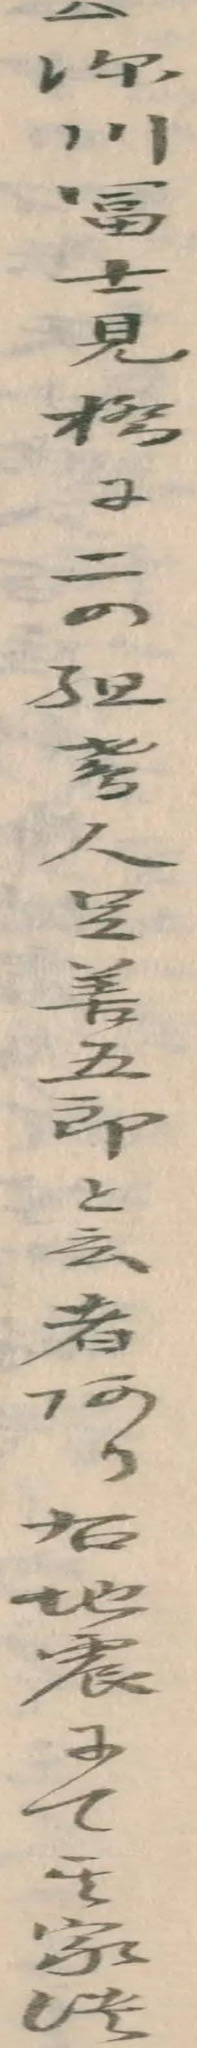△深川冨士見橋に二の組鳶人足善五郎と云者あり右地震にて其家潰
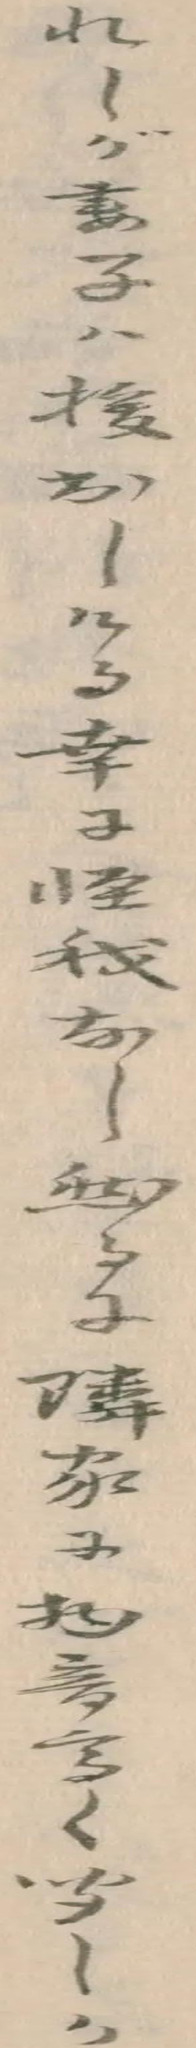れしが妻子は援出しける幸に怪我なし然るに隣家に物音高く聞しか
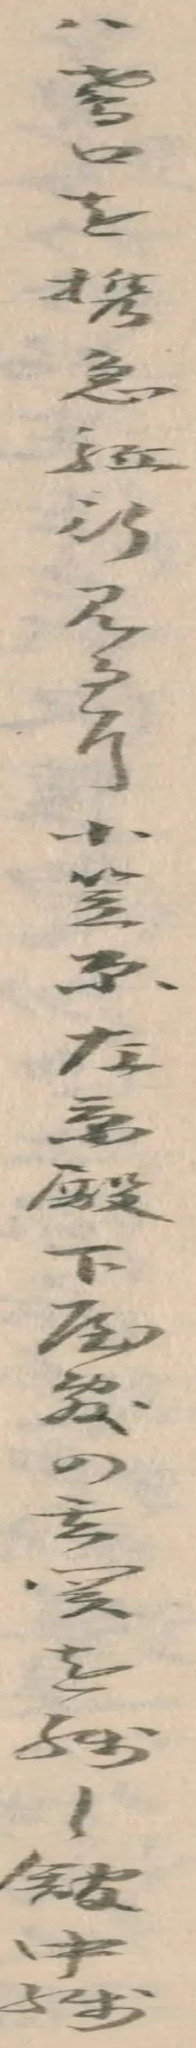は鳶口を携急駈行見るに小笠原左京殿下屋敷の玄関を残し舘中残
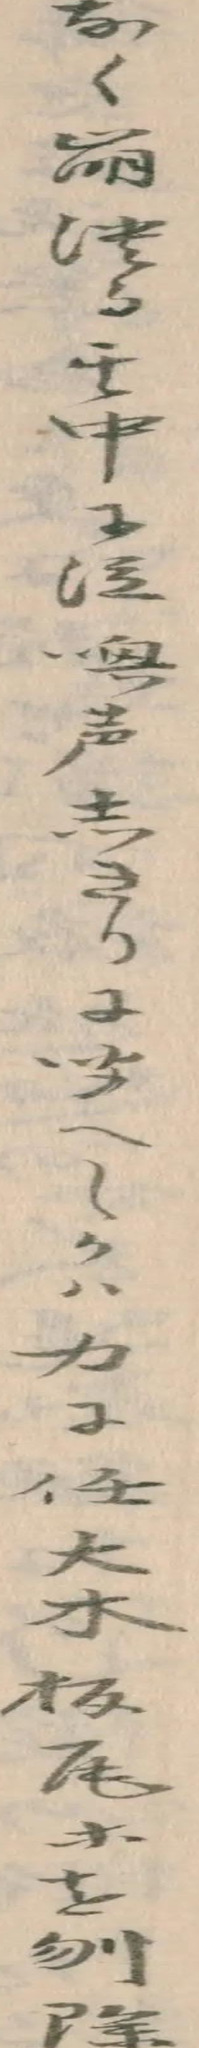なく崩潰る其中に泣喚声しきりに聞へしかは力に任大木板瓦等を刎除
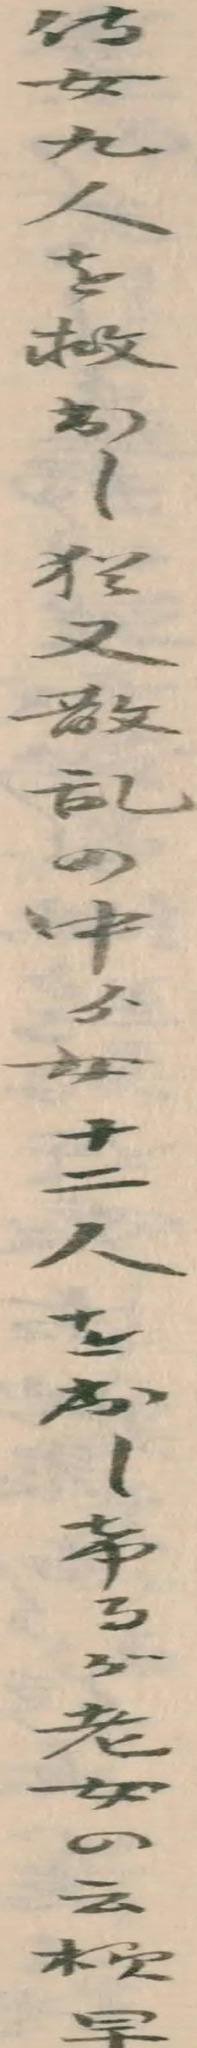侍女九人を救出し猶又散乱の中ゟ女十二人を出しけるが老女の云様早
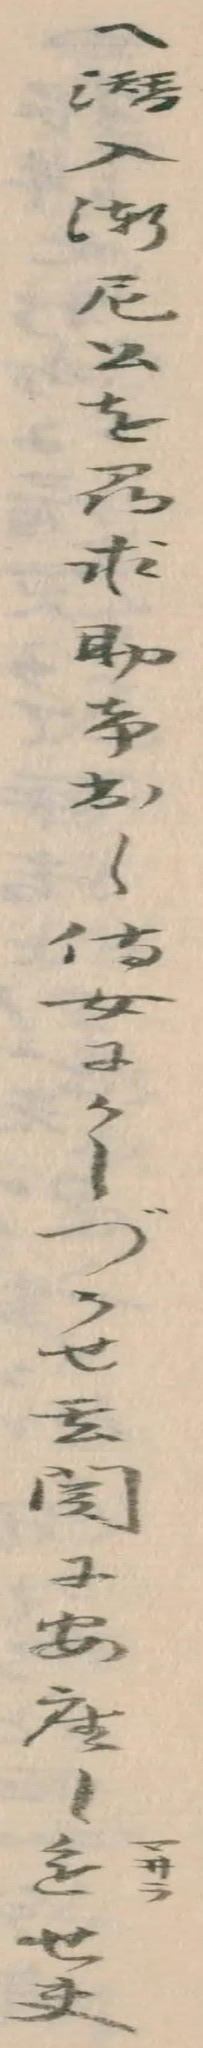へ潜入漸尼公を尋求助け出し侍女にかしづかせ玄関に安座し参せ夫
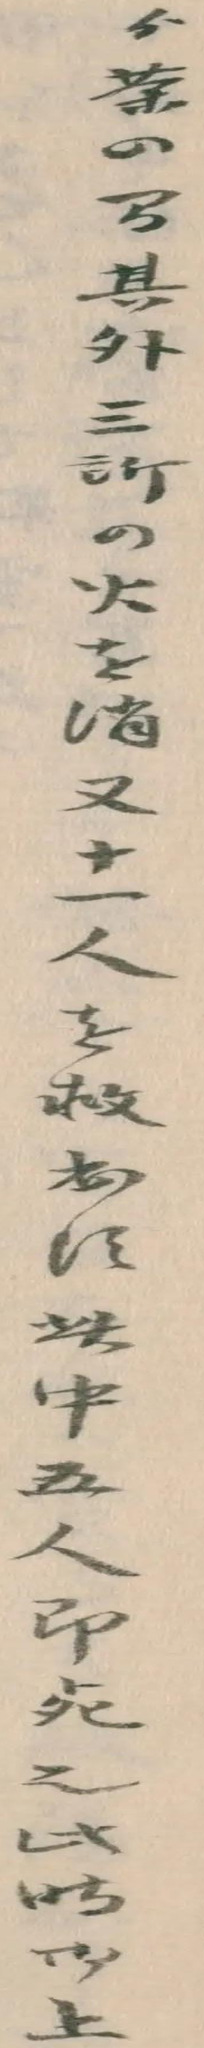ゟ茶の間其外三所の火を消又十一人を救出す此中五人即死也此時御上
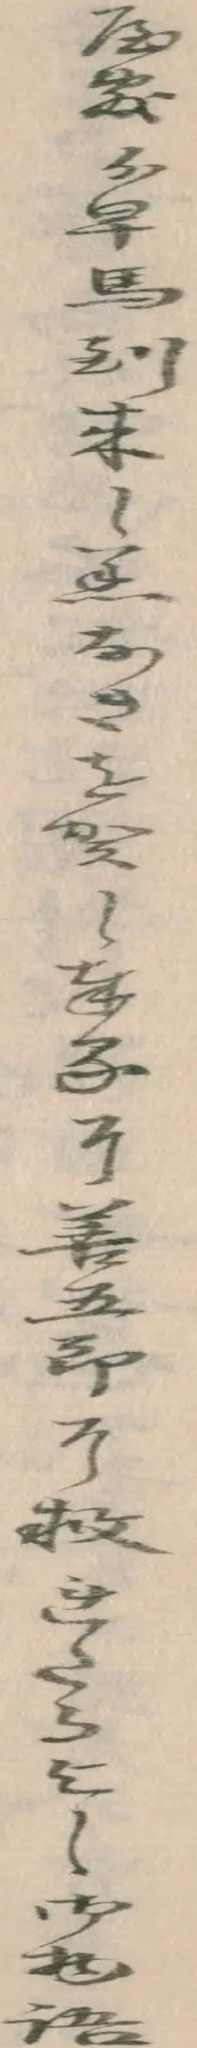屋敷ゟ早馬到来し恙なきを賀し奉るに善五郎に救れたるよし御物語
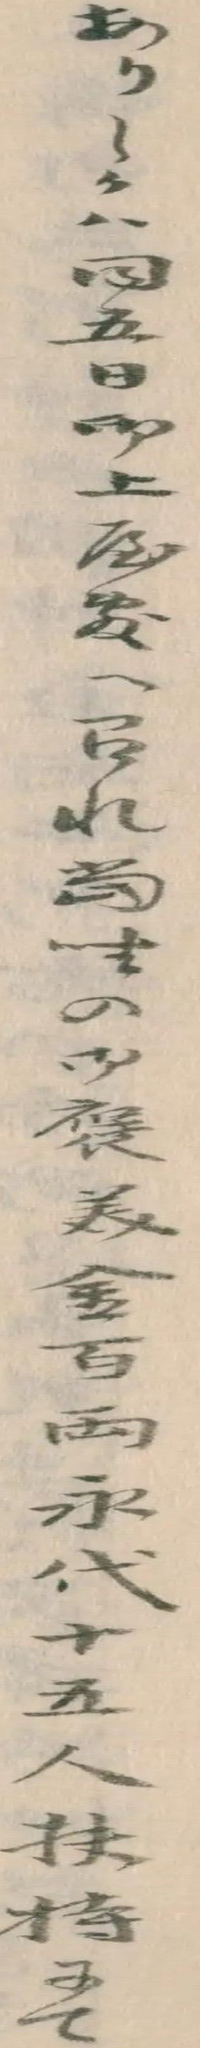ありしかは同五日御上屋敷へ召れ当坐の御褒美金百両永代十五人扶持にて
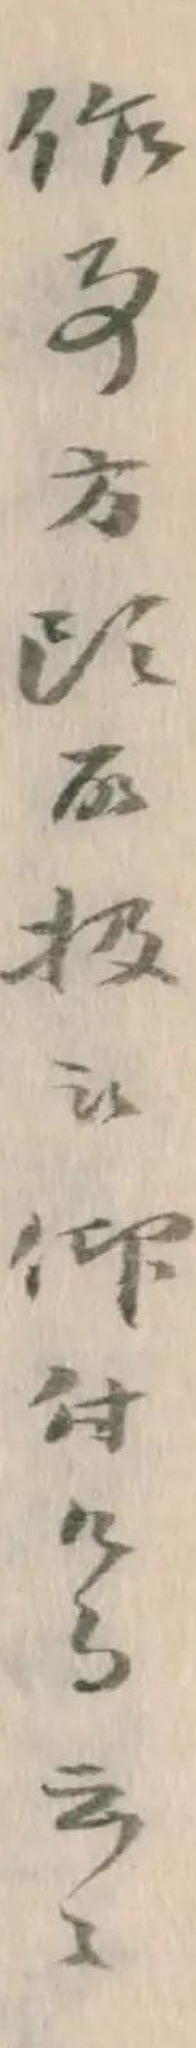作事方頭取扱被仰付ける云々
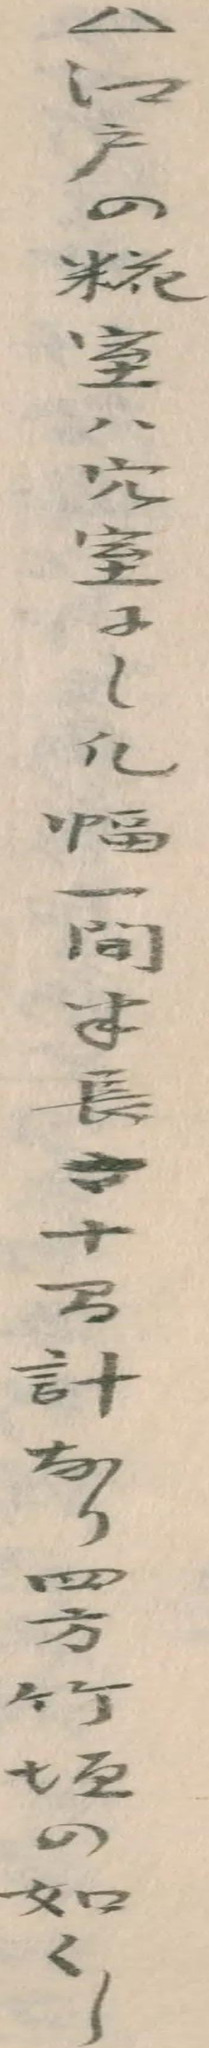△江戸の糀室は穴室にし凡幅一間半長さ十間計なり四方竹垣の如くし
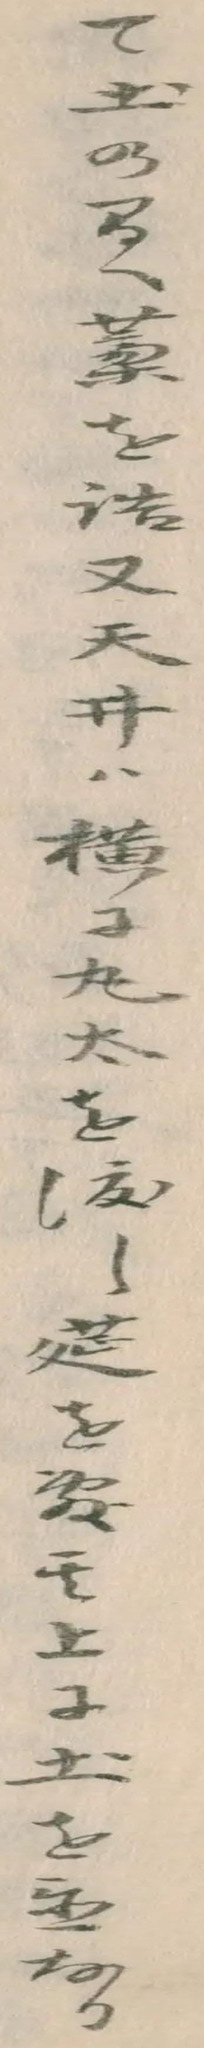て土の間へ藁を詰又天井は横に丸太を渡し筵を敷其上に土を置なり
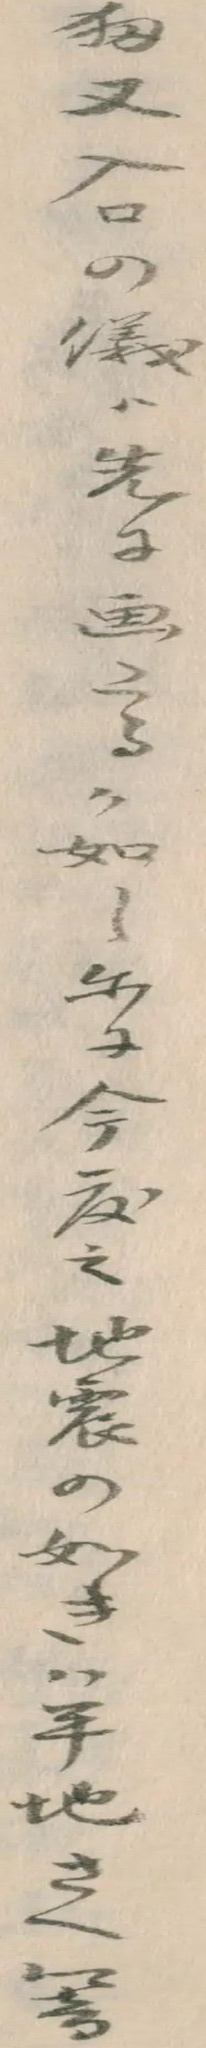扨又入口の儀は先に画たるか如し尓に今度之地震の如きは平地さへ響
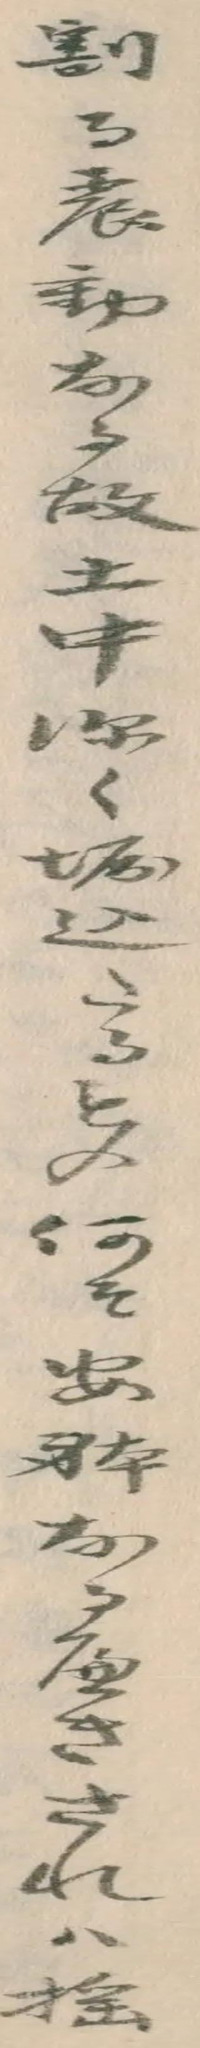割る震動なる故土中深く掘込たるもの何そ安躰なるへきされは揺

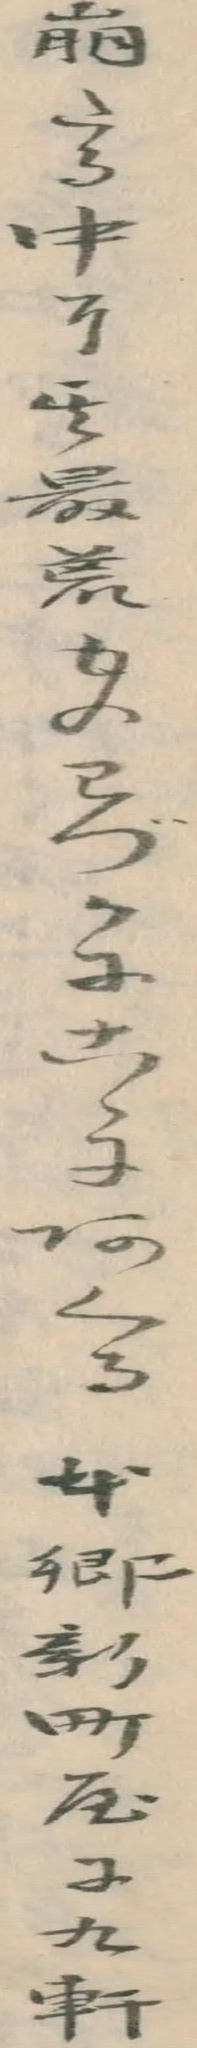崩たる中に其最荒ものわづかにこゝにあくる本郷新町屋に九軒
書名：地災撮要. 巻10(地震之部) 上,下
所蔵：国立国会図書館 National Diet Library, JAPAN
